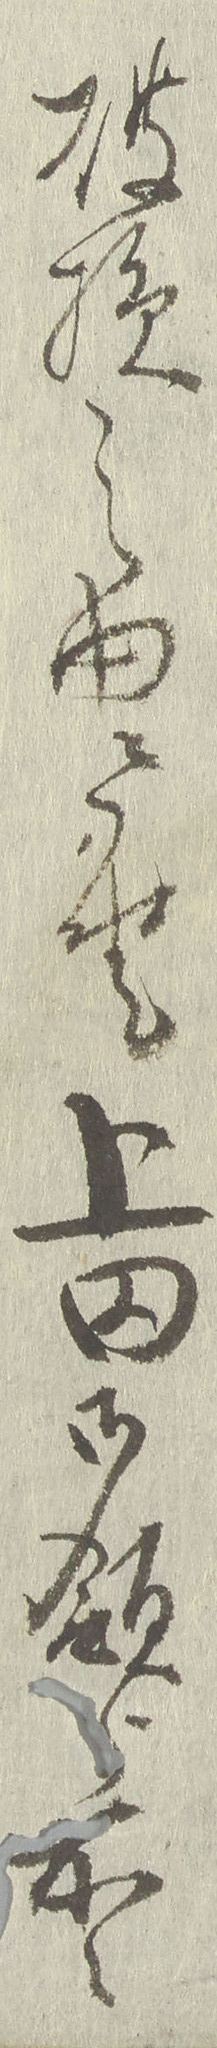破損之由ニ御座候上田御領分所々
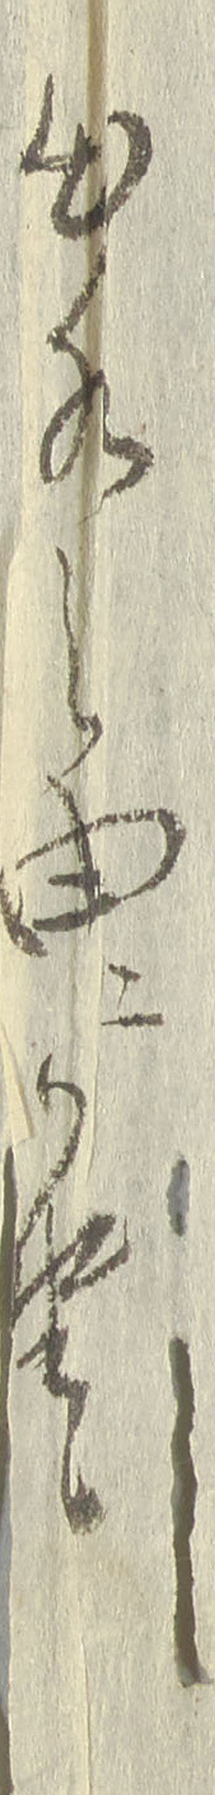出水之由ニ御座候
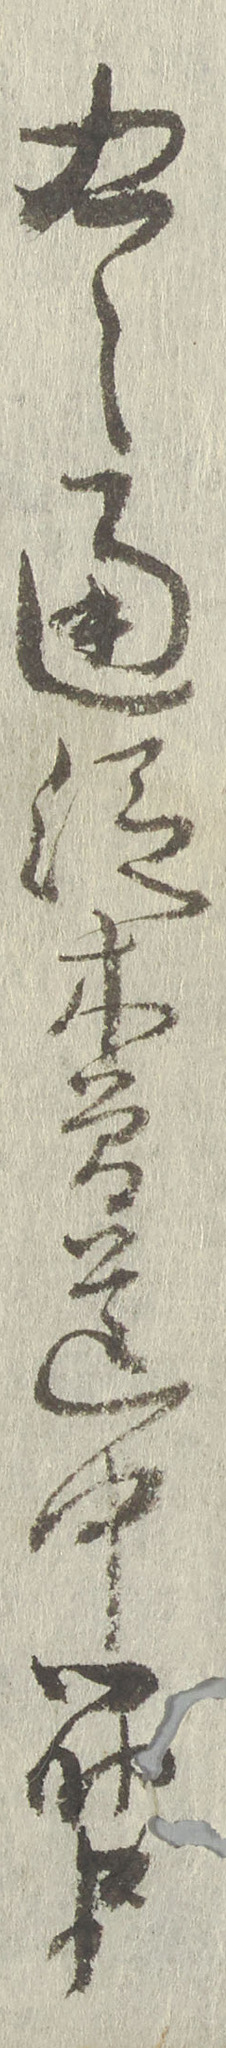右の通り従木曽道中筋申
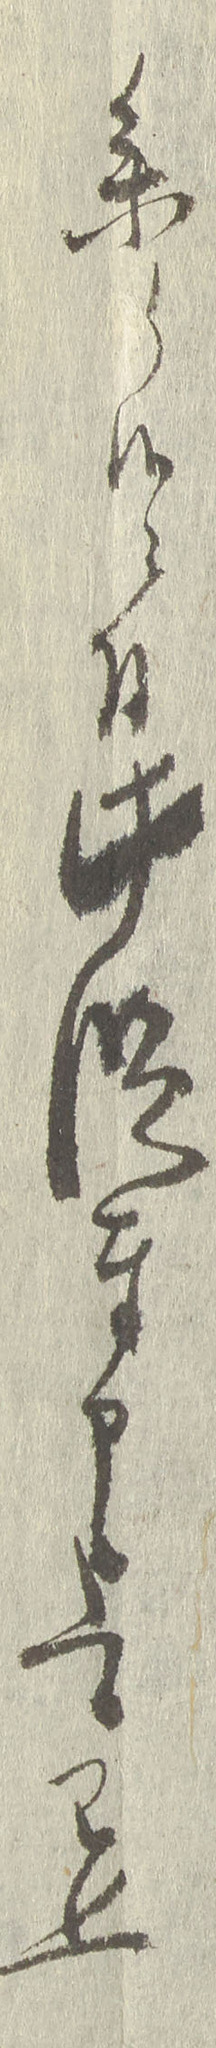参り候ニ付此段奉申上候已上
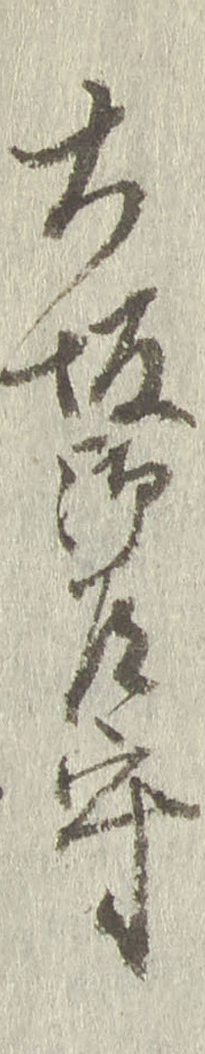大坂御道守
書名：信濃大地震
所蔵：東京大学総合図書館 General Library in the University of Tokyo, JAPAN
